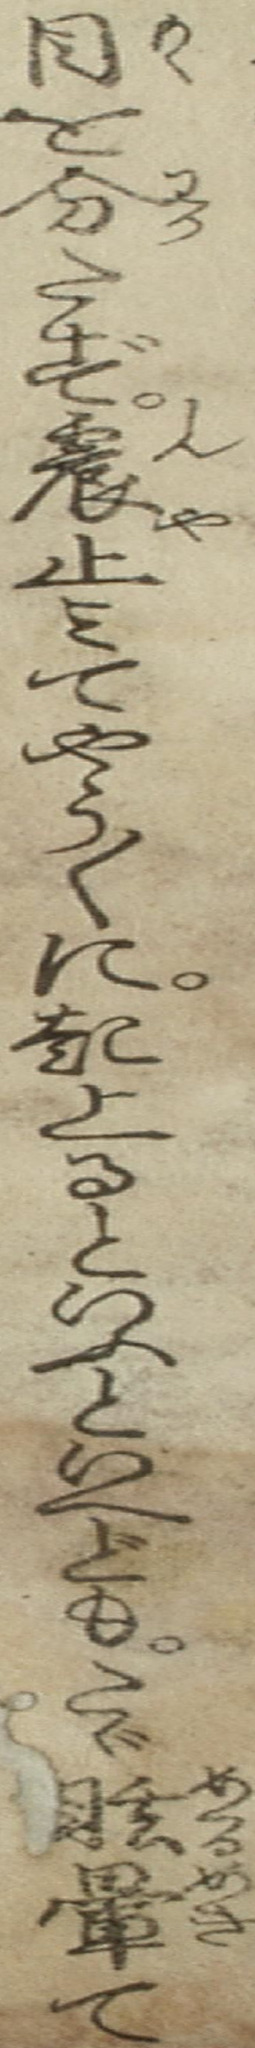目を分たず。震止みてやう〳〵に。起上るといふといへども。たゞ眩暈て
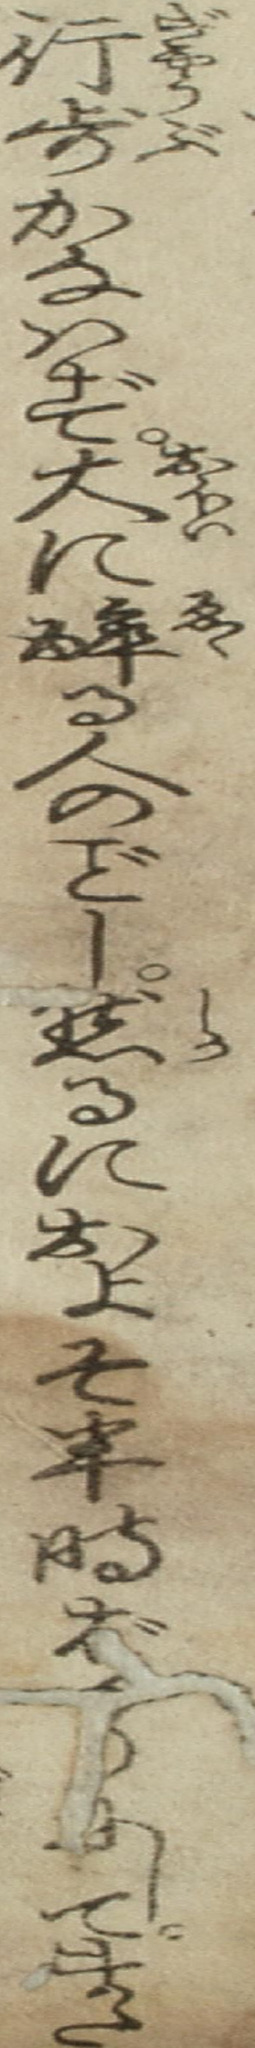行歩かなはず。大に酔る人のごとし。然るにおよそ半時ばかりにして。また
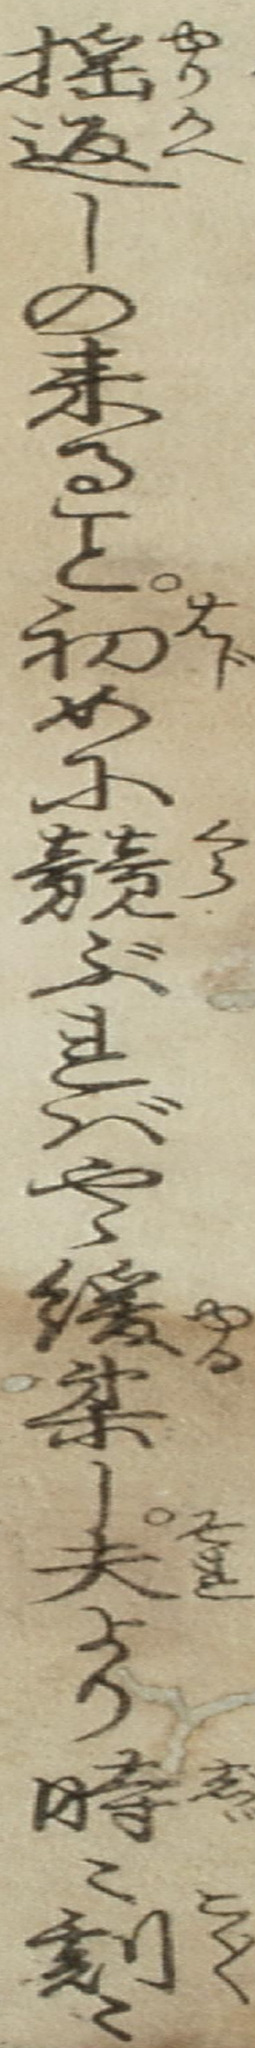揺返しの来ること。初めに競ぶればやゝ緩柔し。夫より時〻刻〻
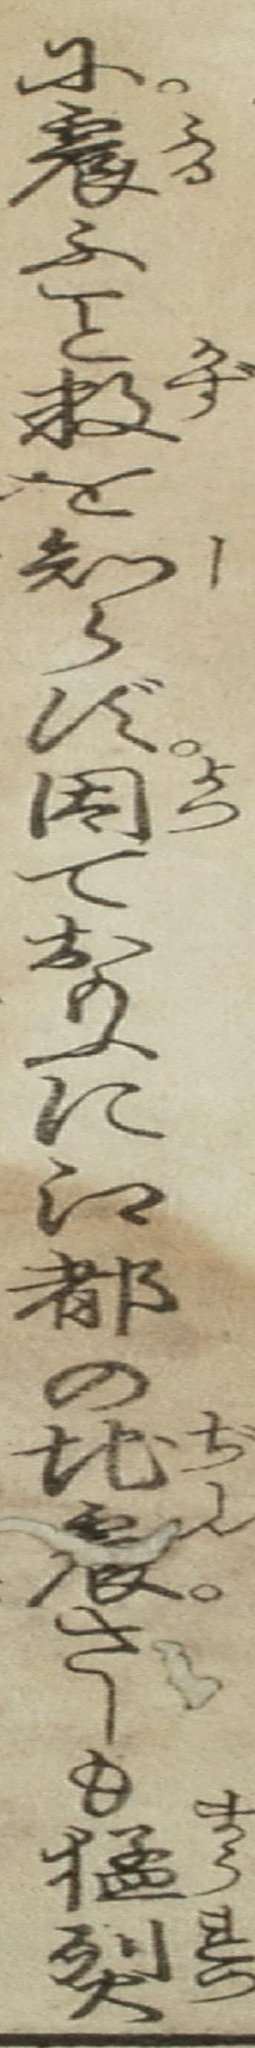に。震ふこと数を知らず。因ておもふに江都の地震。さしも猛烈
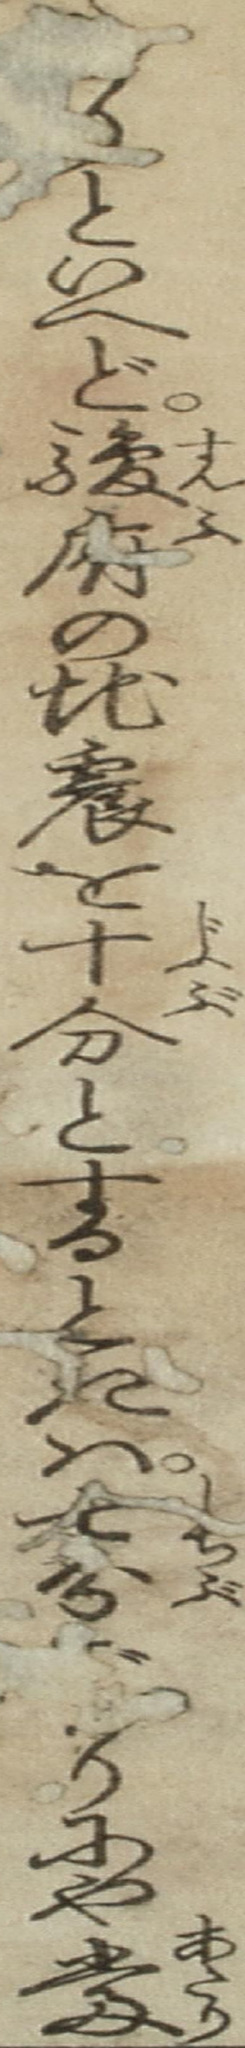なりといへど。駿府の地震を十分とするときは。七分ばかりにや當
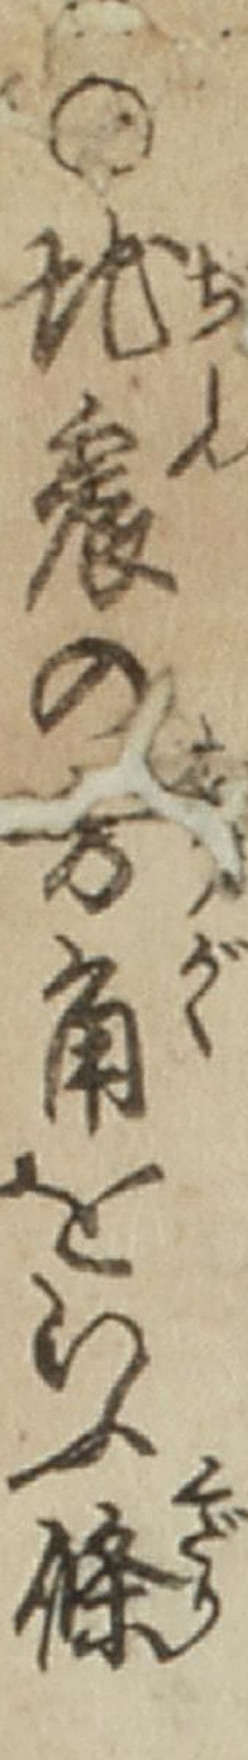〇地震の方角をいふ条
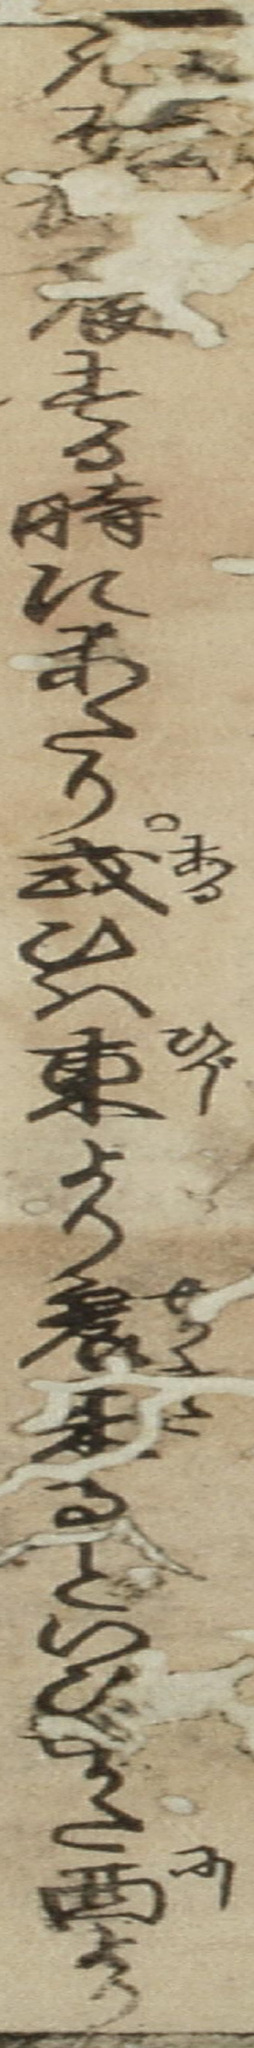凡そ地震する時にあたり。或ひは東より震来るといひまた西より
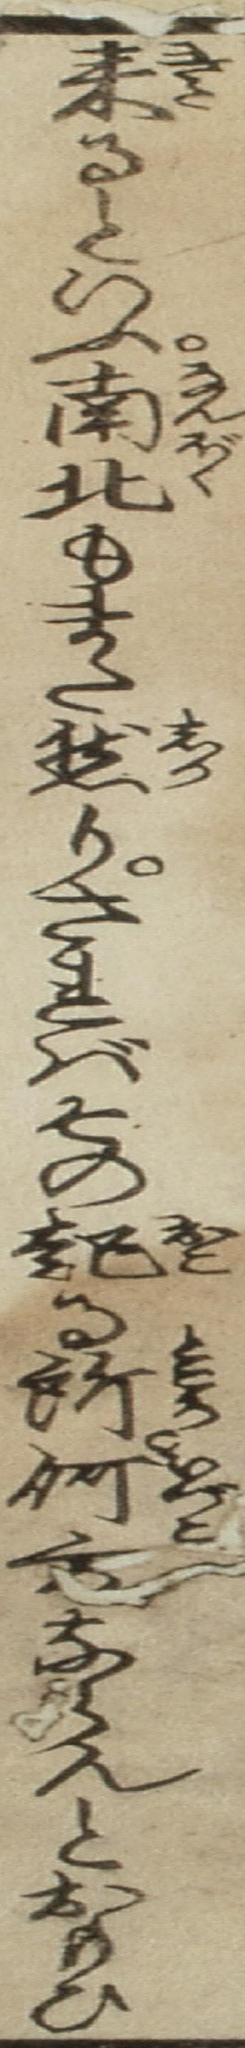来るといふ。南北もまた然り。さればその起る所。何方ならんとおもひ
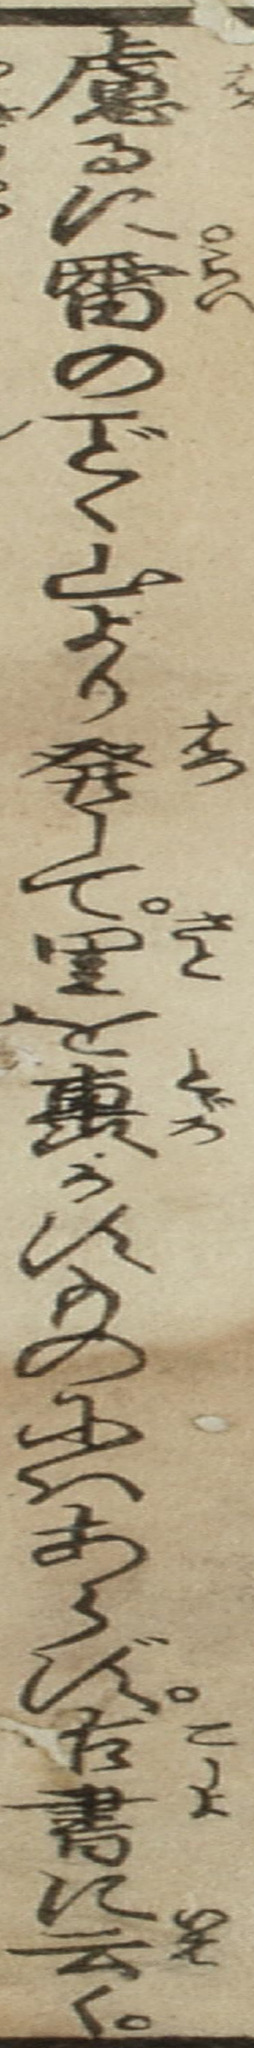慮るに。雷のごとく山より発して。里を轟かすものにはあらず。古書に云く。
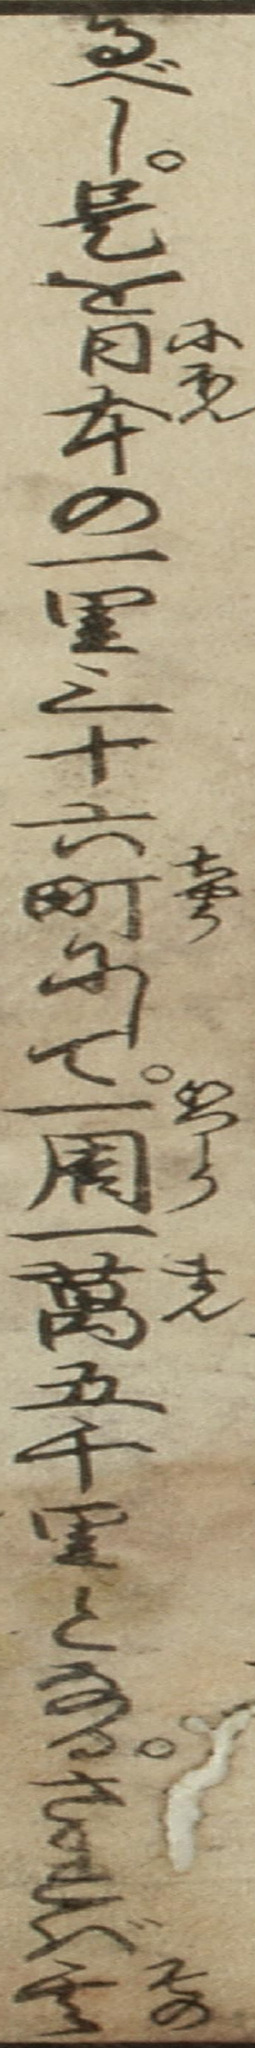るべし。是を日本の一里三十六町にして。一周一萬五千里となる。されば其
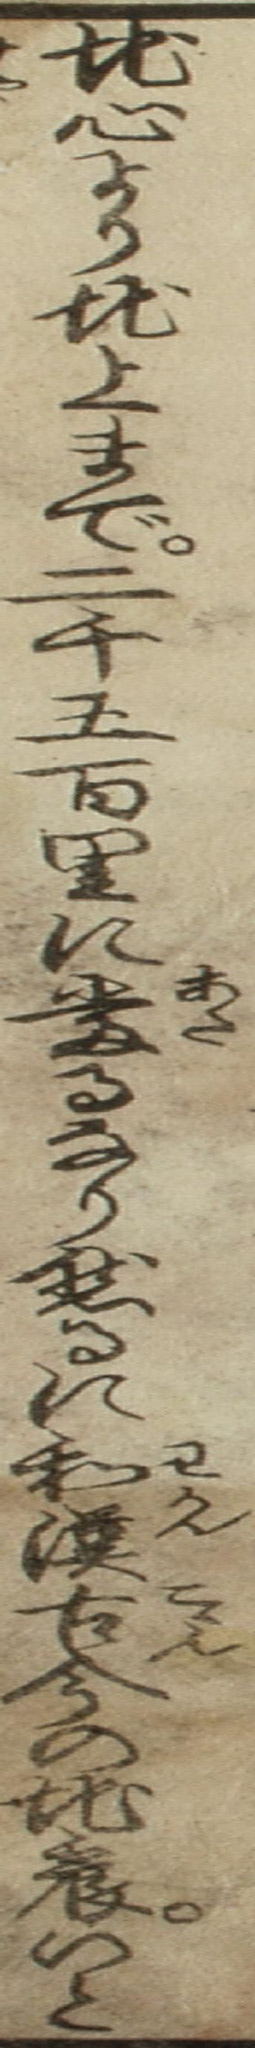地心より地上まで。二千五百里に當るなり然るに和漢古今の地震。いと
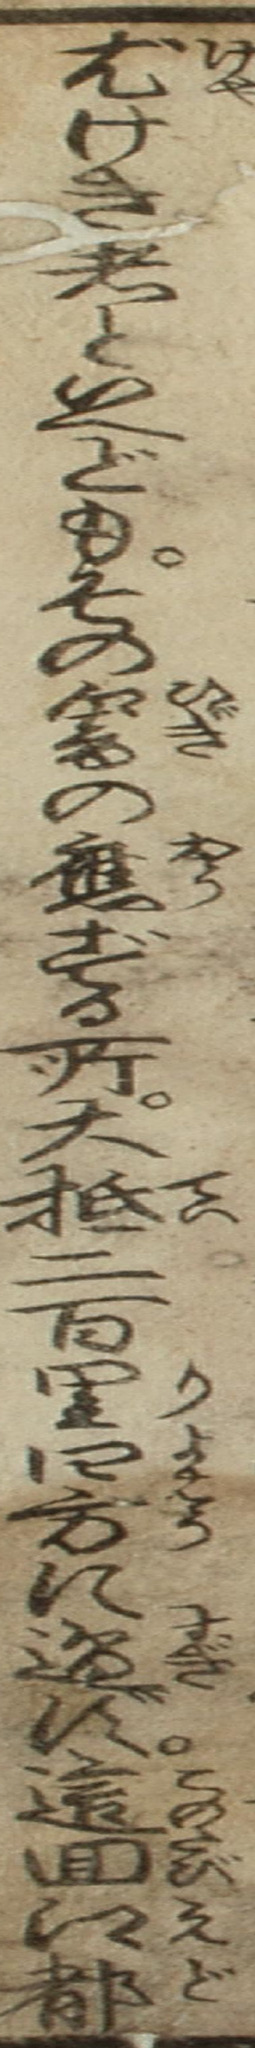尤けき者といへども。その響の応ずる所。大抵二百里四方に過ず。這回江都
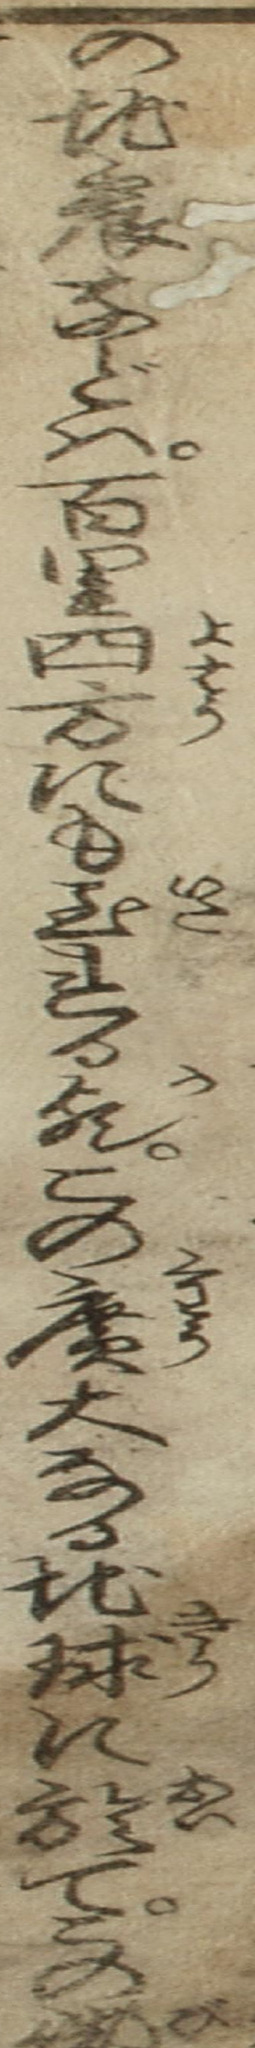の地震などは。百里四方にも至れる歟。この広大なる地球に於て。この微
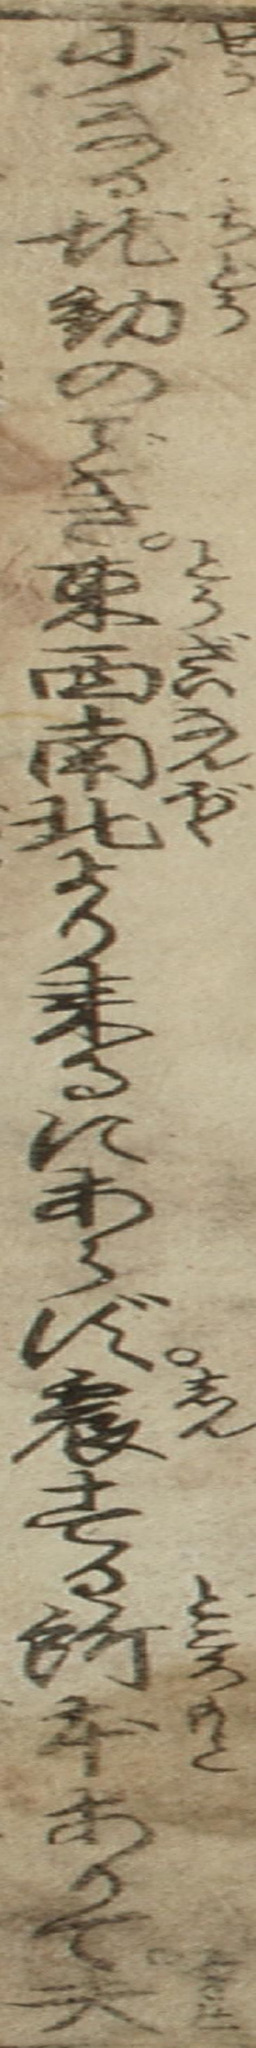少なる地動のごとき。東西南北より来るにあらず。震する所本ありて。夫

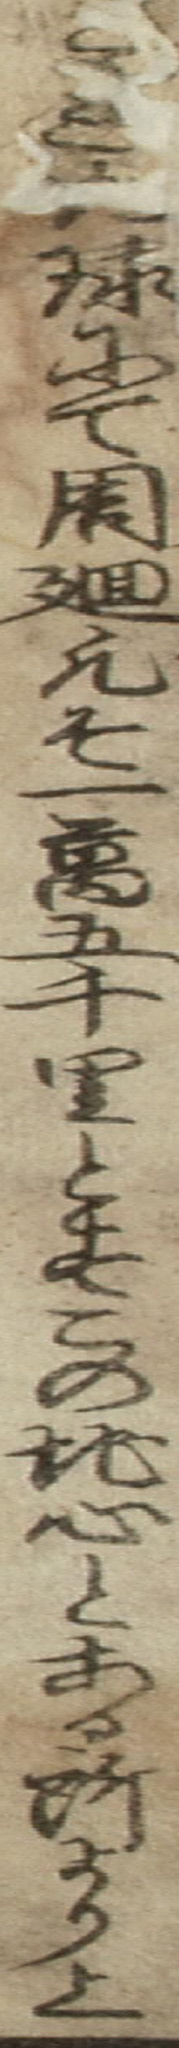これ地球にて周迴凡そ一万五千里とすこの地心とある所より上
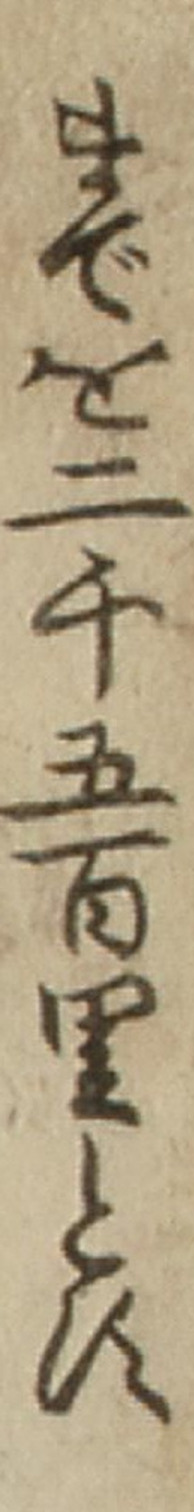までを二千五百里とす
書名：安政見聞録　中
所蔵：東京大学地震研究所図書室 Earthquake Research Institute Library, The University of Tokyo, JAPAN
